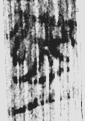○（吾）
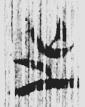之
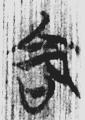命（令）
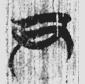尹
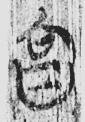○（答）
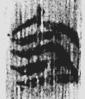命
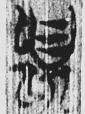須
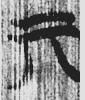亓（其）
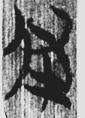侓（盡）
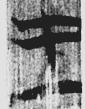王
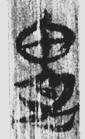{胃刀}（謂）
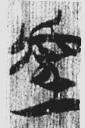○（吾）
